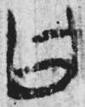曰
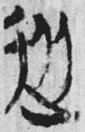從
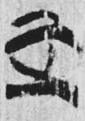正（政）
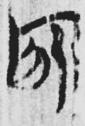所
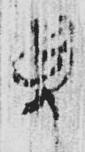○（務）
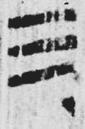三
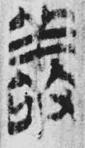敬
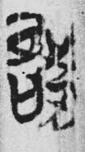誂
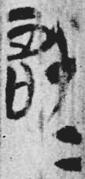信信
